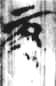亥
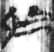於
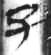子
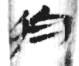於
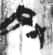丑
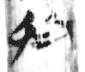於
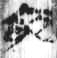寅
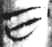日
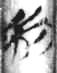利（利）
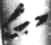㠯（以）
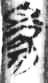○（嫁）
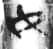女
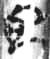見
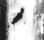人
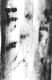○（佩）
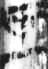玉
